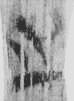之
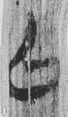㠯（以）
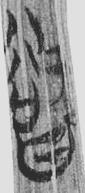智（知）
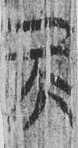天
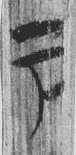下
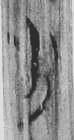少（小）
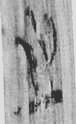之
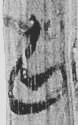㠯（以）
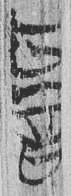○（治）
